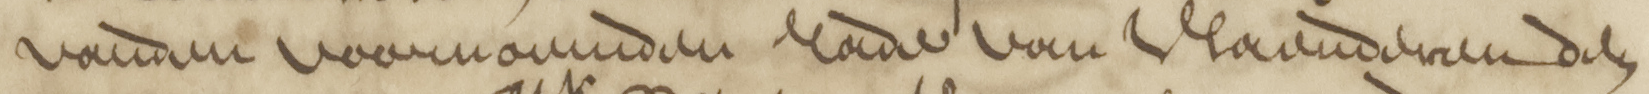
vanden voornoemden Rade van Vlaenderen den
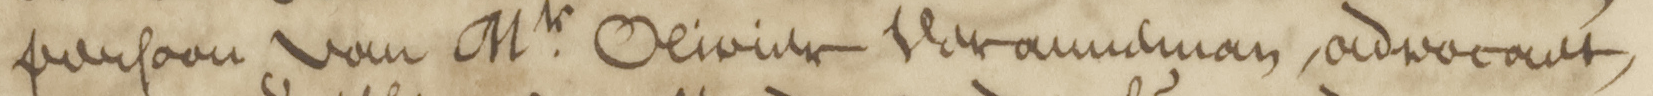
persoon van Mr. Olivier Veranneman, advocaet,
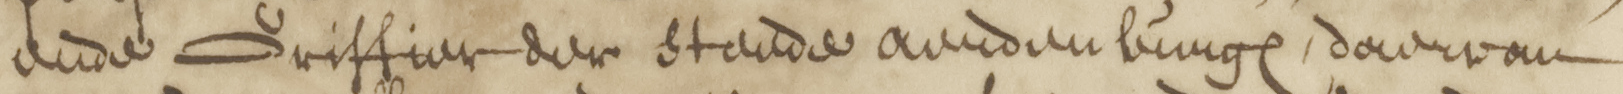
ende Griffier der Steede Aerdenburgh, daervan
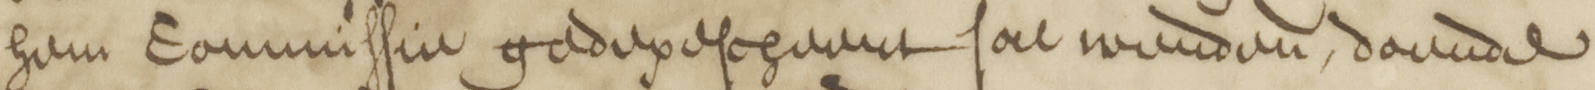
hem Commissie gedepescheert sal werden, doende
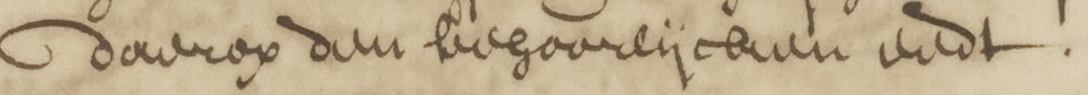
daerop den behoorlijcken eedt.
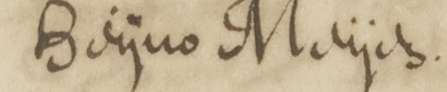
Heijno Meijen.
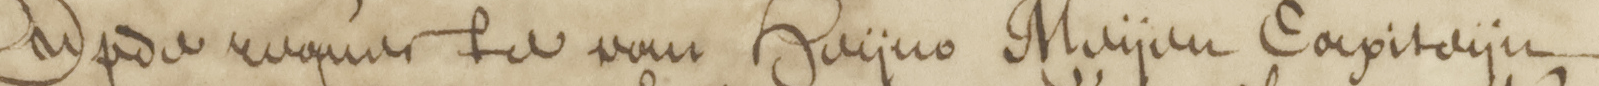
Opde requeste van Heijno Meijen Capiteijn
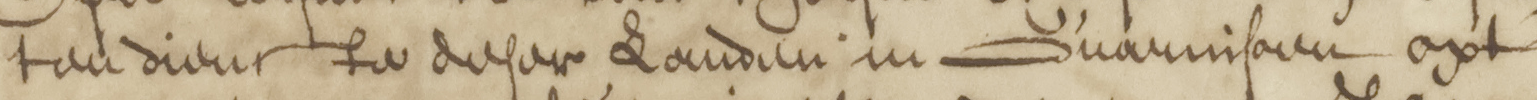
ten dienste deser Landen in Guarnisoen opt‛
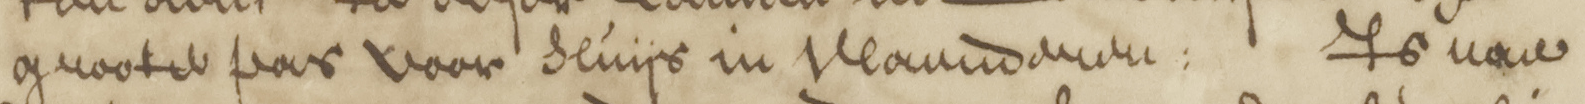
groote pas voor Sluijs in Vlaenderen: Is nae
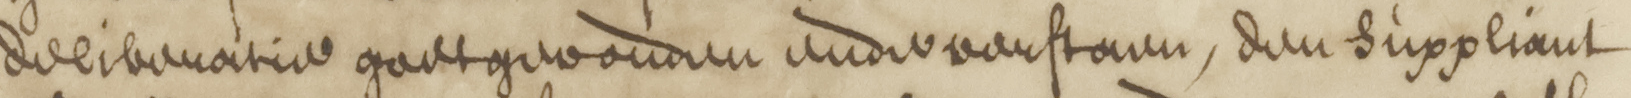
deliberatie goetgevonden ende verstaen, den Suppliant
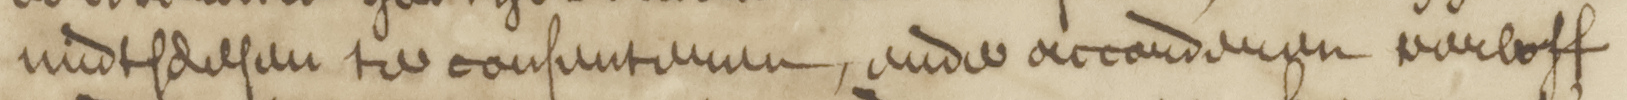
midtsdesen te consenteren, ende accorderen verloff
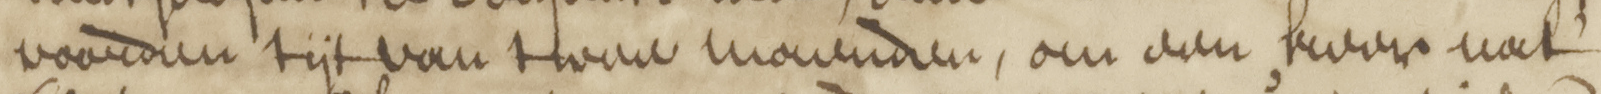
voorden tijt van twee maenden, om een keer nat'
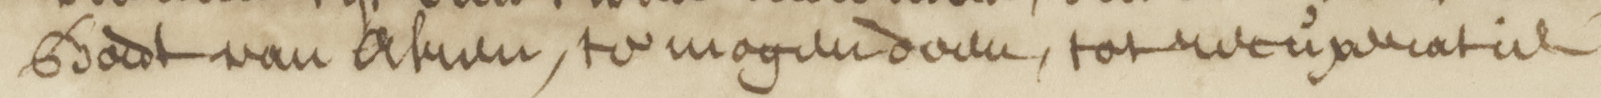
Badt van Aken, te mogen doen, tot recuperatie
